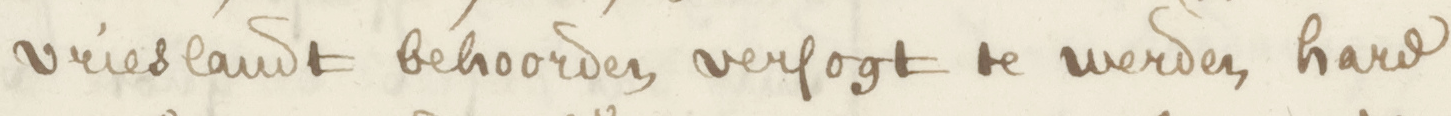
„vrieslandt behoorden versogt te werden hare
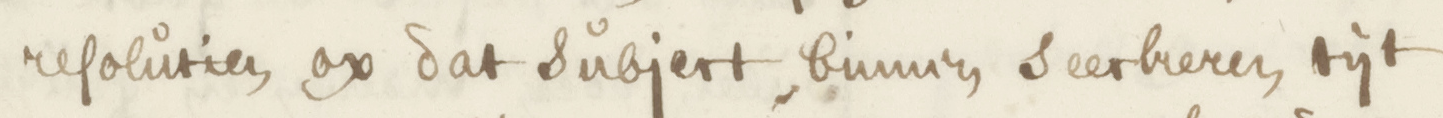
resolutien op dat subject binnen seeckeren tijt
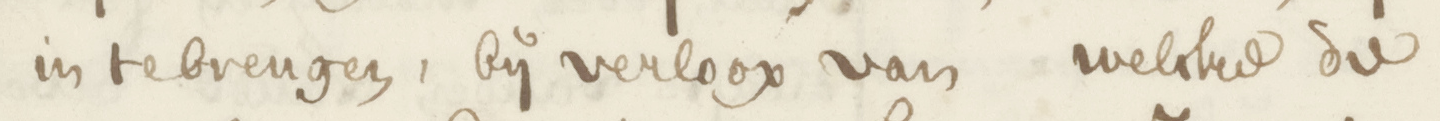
in te brengen, bij verloop van welcke de
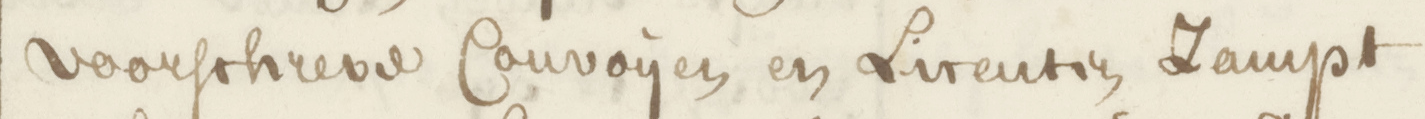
voorschreve Convoijen en Licenten Zampt
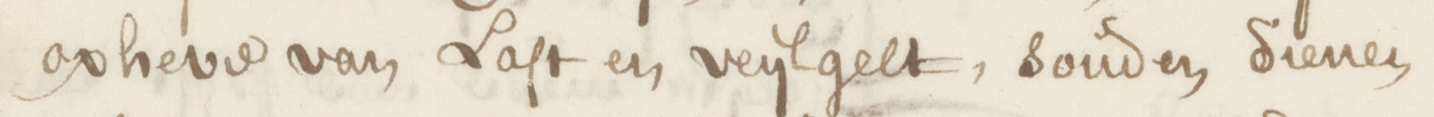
opheve van Last en veijlgelt, souden dienen
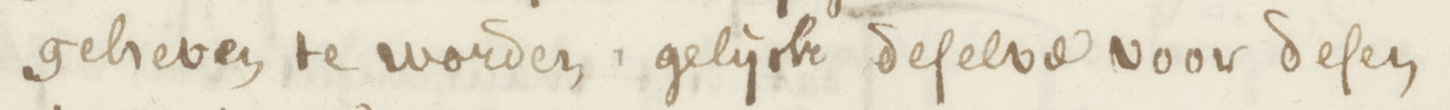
geleven te worden, gelijck deselve voor desen
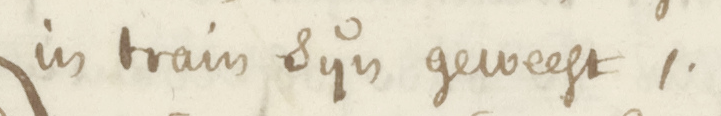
in train sijn geweest.
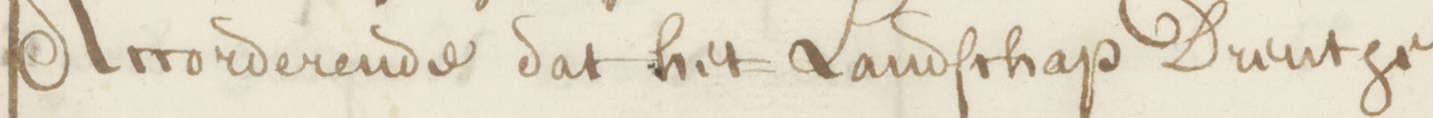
orderende dat het Landschap Drenthe
